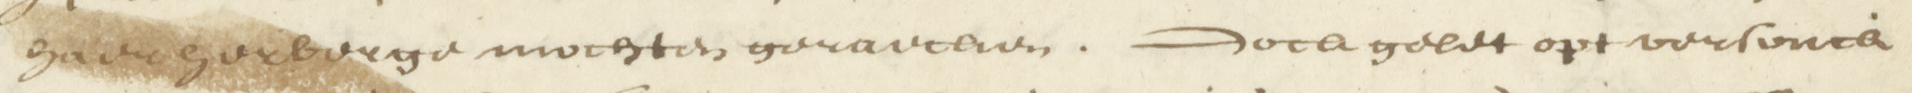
haer herberge mochten geraecken. Oock gelet opt versouck
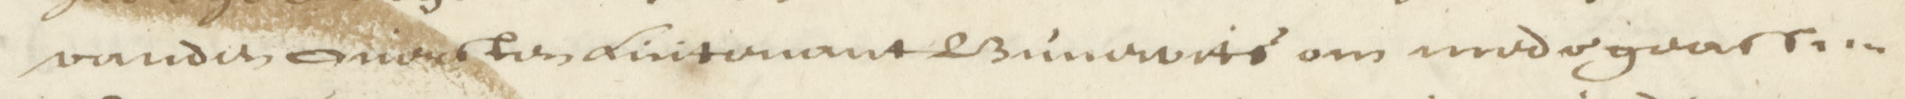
vanden ouersten Luitenant Bunewits om mede geassi,,
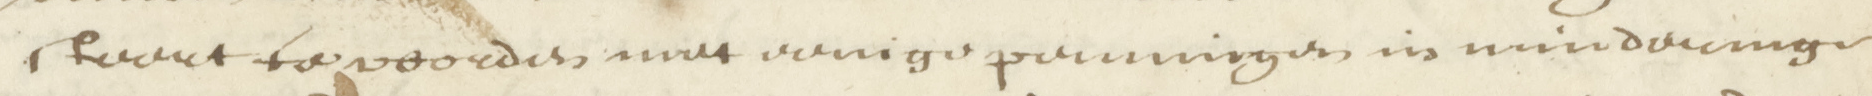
steert te worden met eenige penningen in minderinge
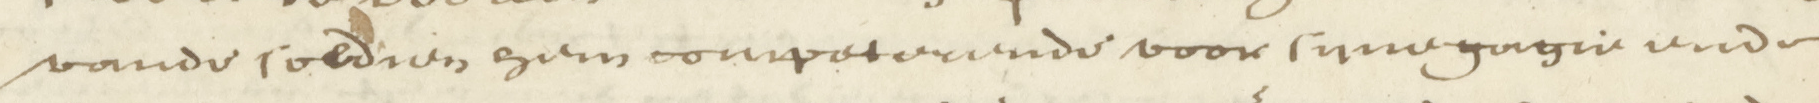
vande soldien hem competerende voor syne gagie ende
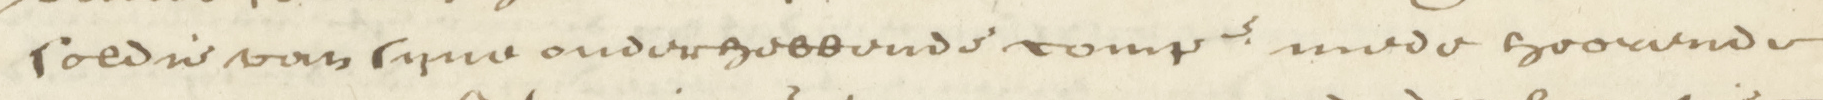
soldie van syne onderhebbende compe mede hoorende
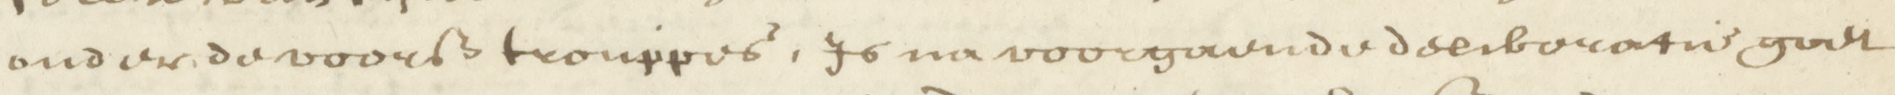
onder de voors trouppes. Is na voorgaende deliberatie goet
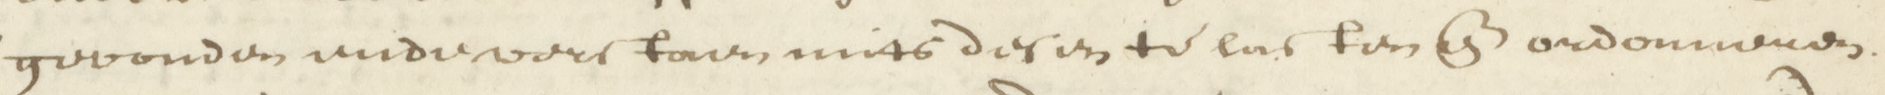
gevonden ende verstaen mits desen te lasten & ordonneren
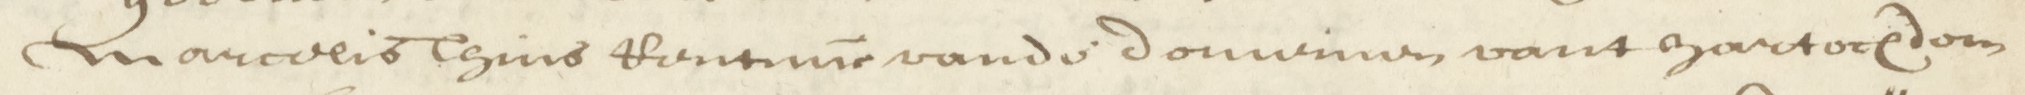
Marcelis Thins Rentmr vande domeinen vant hartochdom
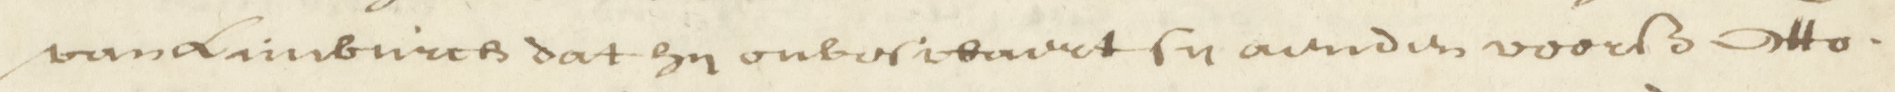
van Limburch dat hy onbeswaert sy aenden voors Otto
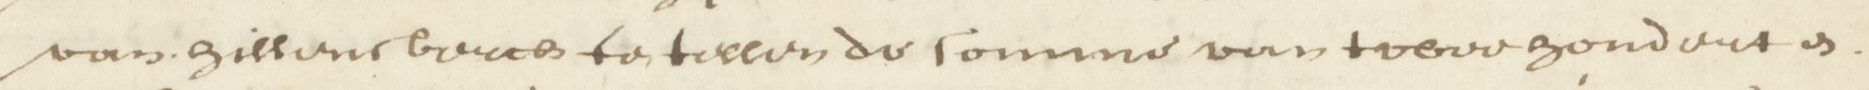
van Hillensberch te tellen de somme van twee hondert en
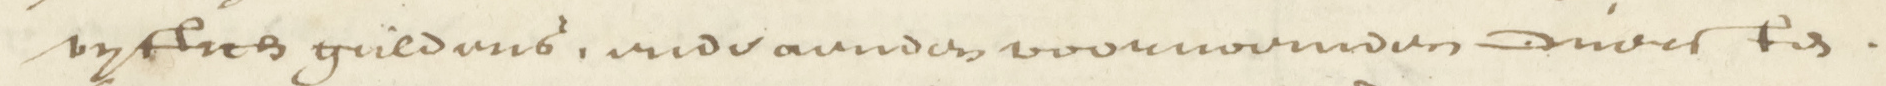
vyftich guldens, ende aenden voornoemden Ouersten
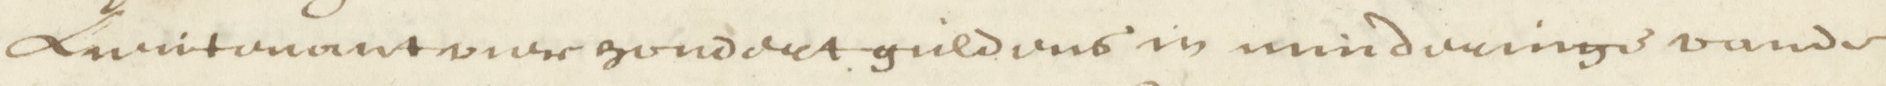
Lieutenant vier hondert guldens in minderinge vande
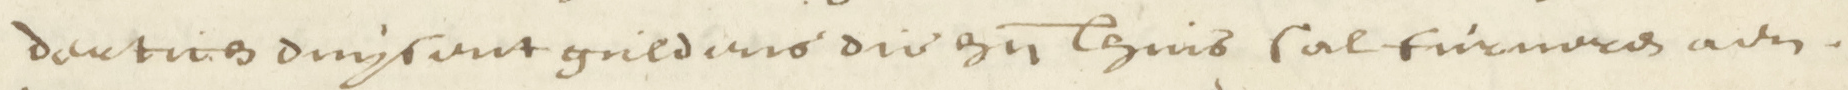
dertich duysent guldens die hy Thins sal furneren aen
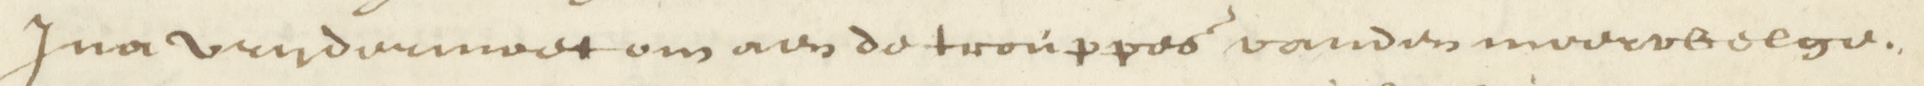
Ina vrydermoet om aen de trouppes vanden meerwelge„
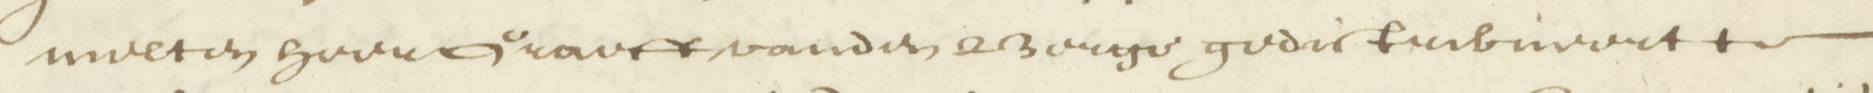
melten heer Graeff vanden Berge gedistribueert te
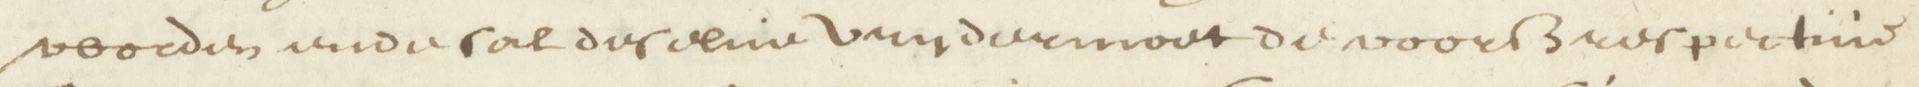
worden ende sal deselue vrydermoet de voors respectiue
